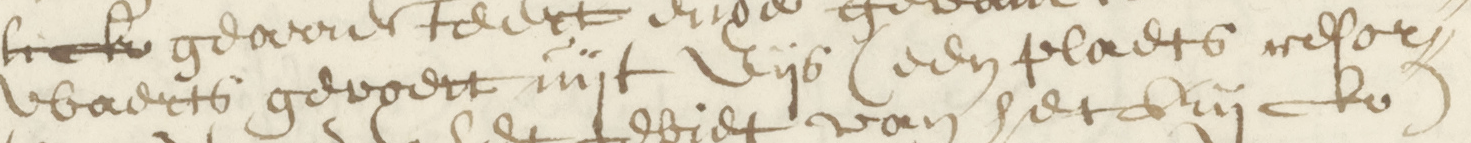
waerts gevoert uijt Eijs (een plaets resor„
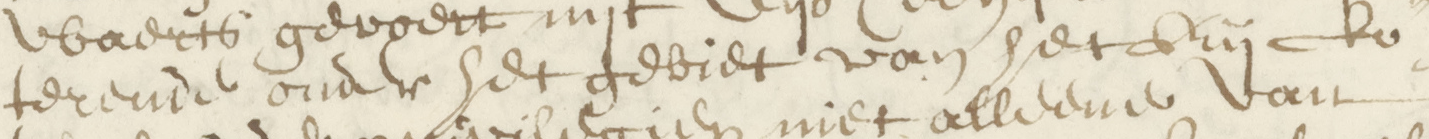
terende onder het gebiet van het Rijck)
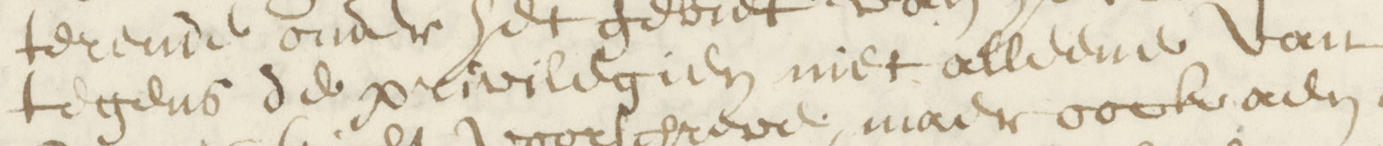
tegens de privilegien niet alleene van
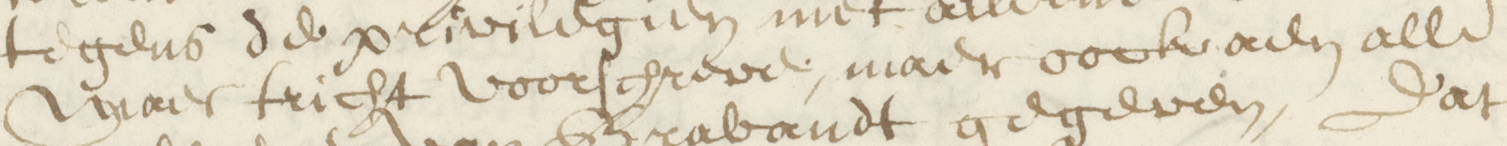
Maestricht voorschreve, maer oock aen alle
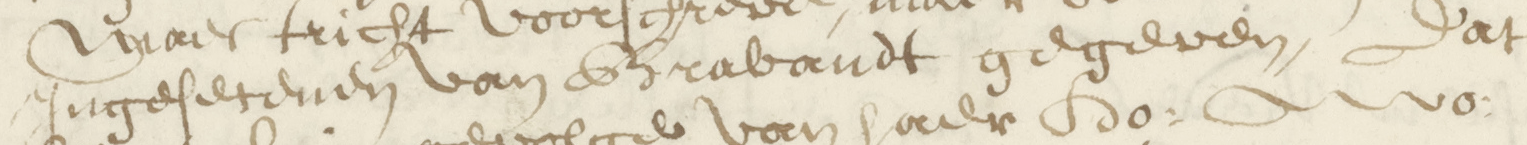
Ingesetenen van Brabandt gegeven, Dat
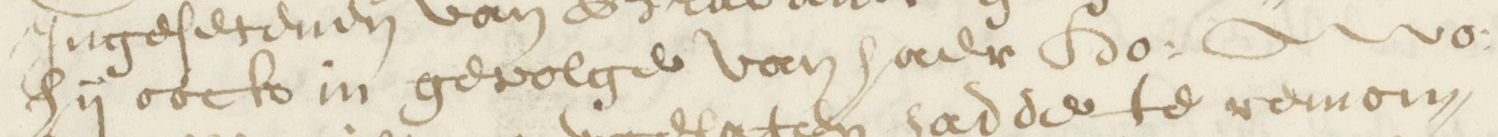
hij oock in gevolge van haer Ho:Mo:
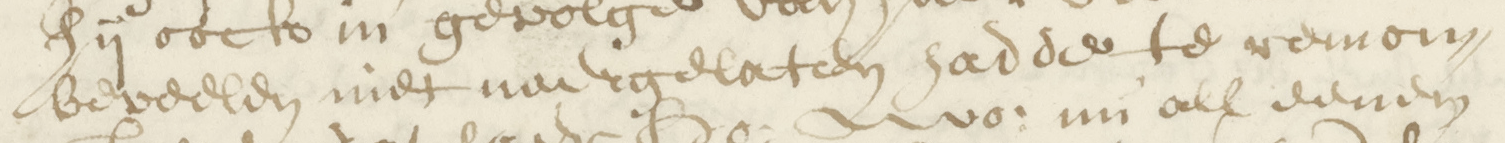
beveelen niet naergelaten hadde te remon„
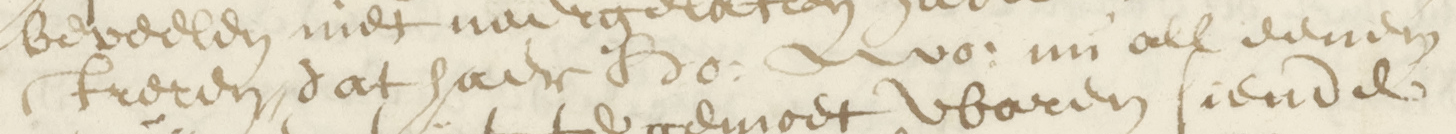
streren, dat haer Ho:Mo: nu all eenen
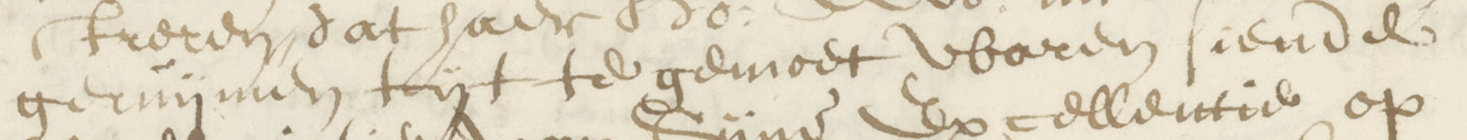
geruijmen tijt te gemoet waren siende
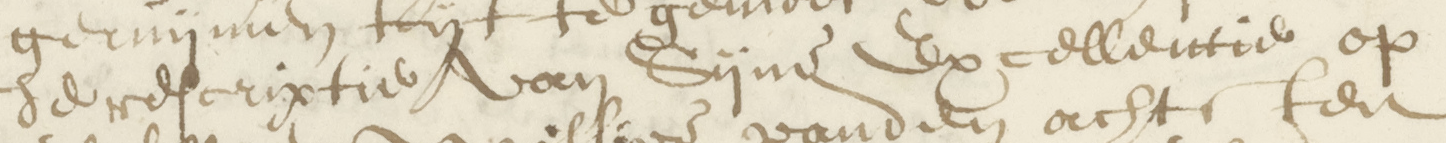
de rescriptie van Sijne Excellentie op
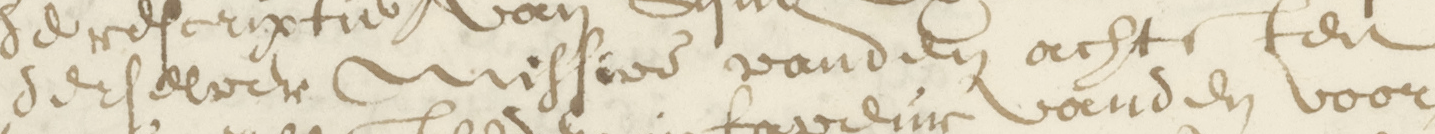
derselver Missive vanden achtsten
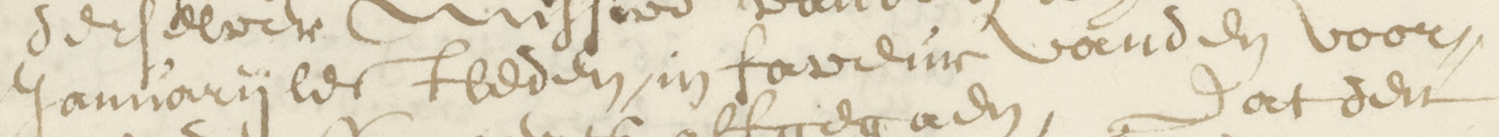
Januarij lestleden, in faveur vanden voor„
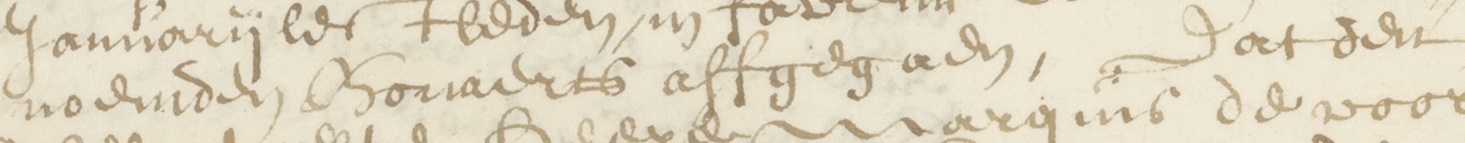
noemden Bonaerts affgegaen, Dat den
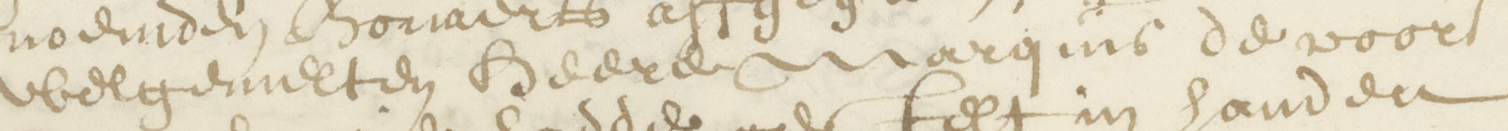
welgemelten Heere Marquis de voors.
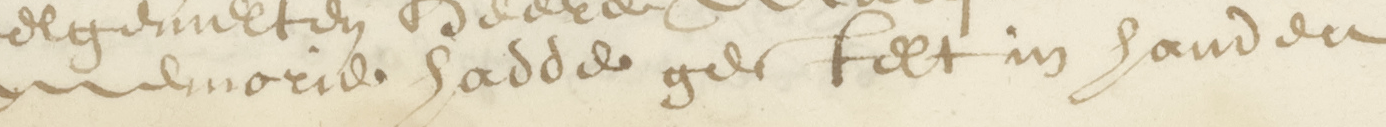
Memorie hadde gestelt in handen
